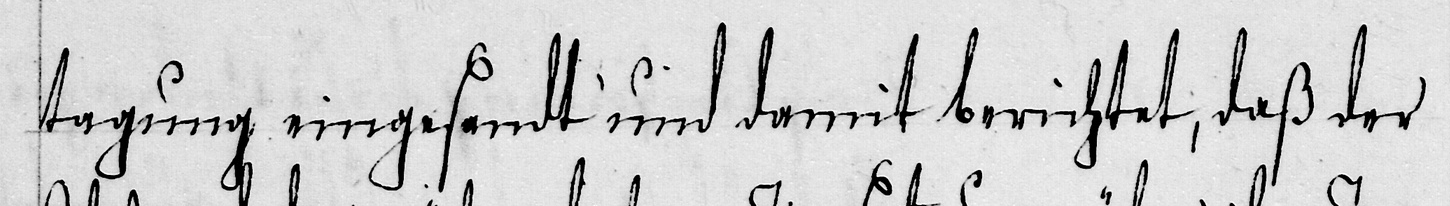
tagung eingesandt und damit berichtet, daß der
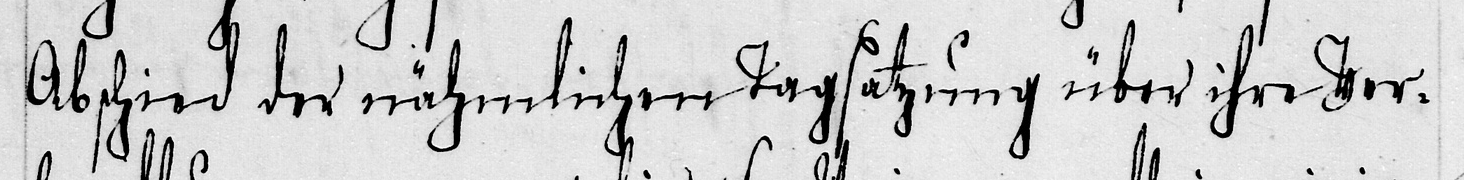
Abschied der nähmlichen Tagsatzung über ihre Ver¬
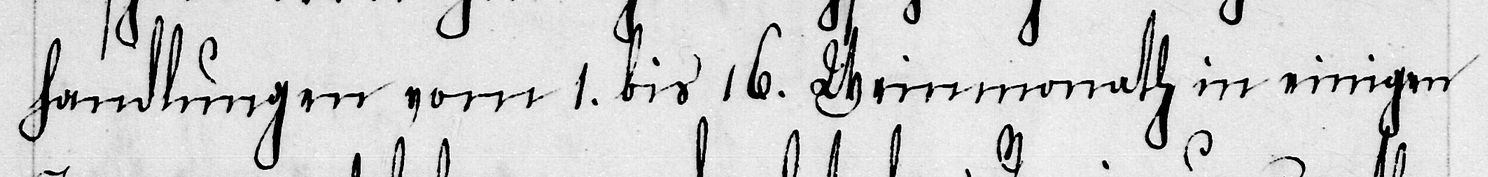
handlungen vom 1. bis 16. Weinmonath in einigen
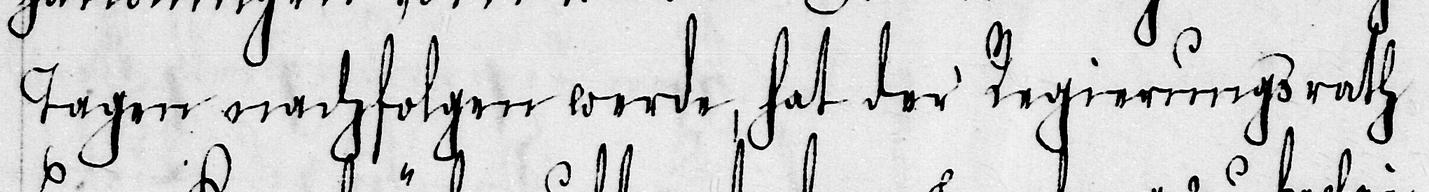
Tagen nachfolgen werde, hat der Regierungsrath
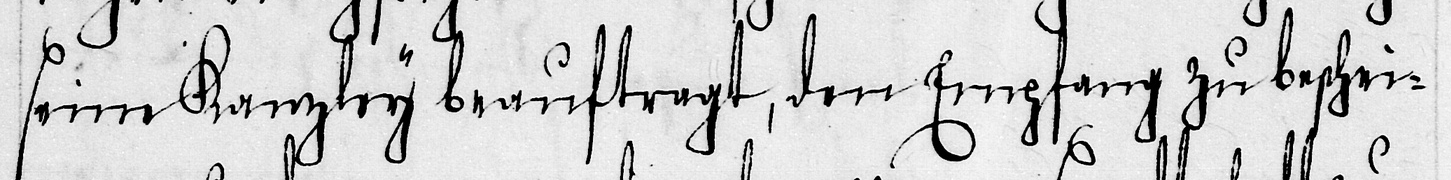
seine Kanzley beauftragt, den Empfang zu beschei¬
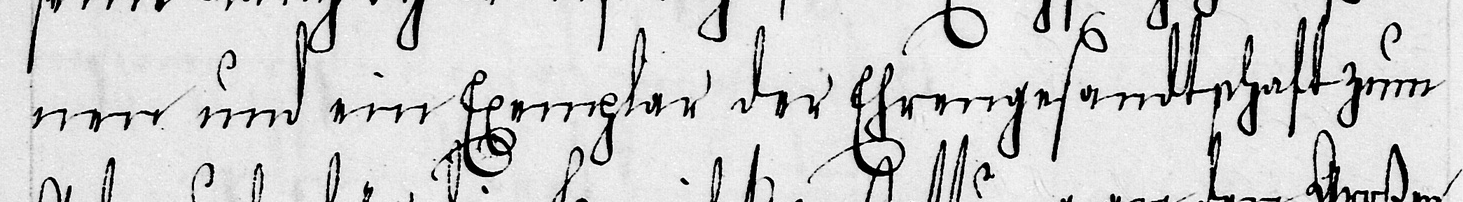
nen und ein Exemplar der Ehrengesandtschaft zum
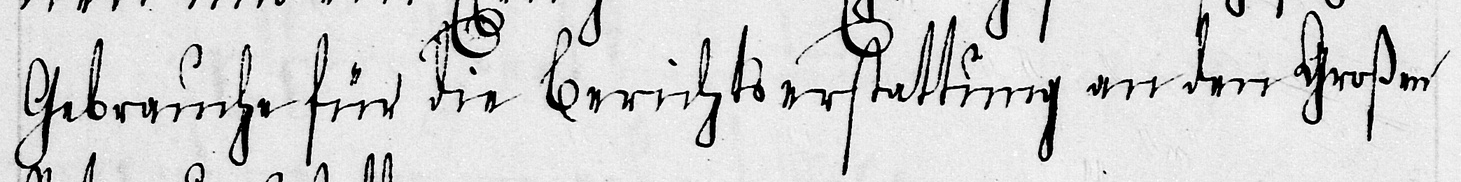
Gebrauche für die Berichtserstattung an den Großen
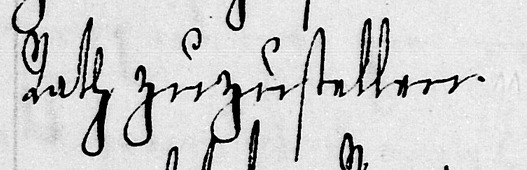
Rath zuzustellen.
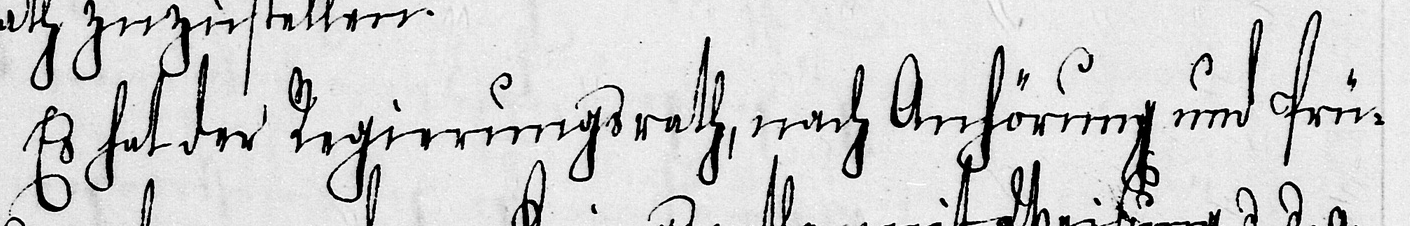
Es hat der Regierungsrath, nach Anhörung und Prü¬
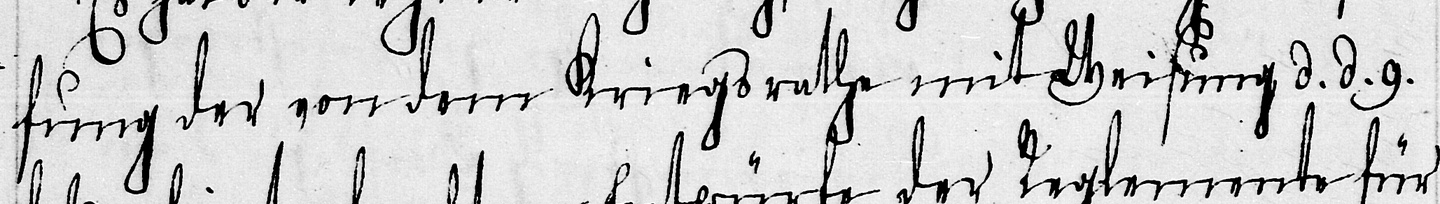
fung der vor dem Kriegsrathe mit Weisung d. d. 9.
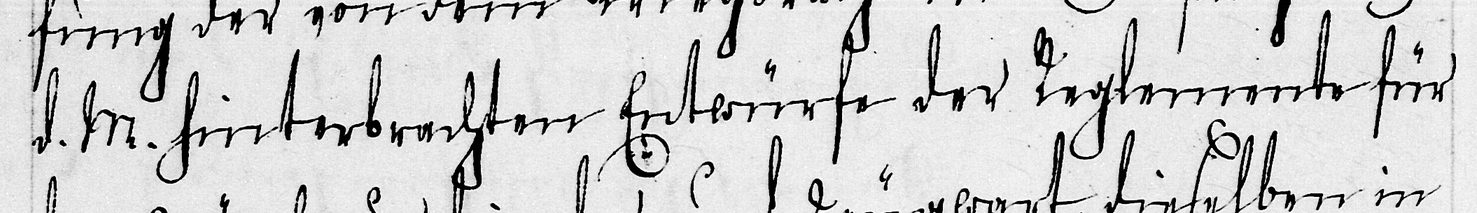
d. M. hinterbrachten Entwürfe der Reglemente für
